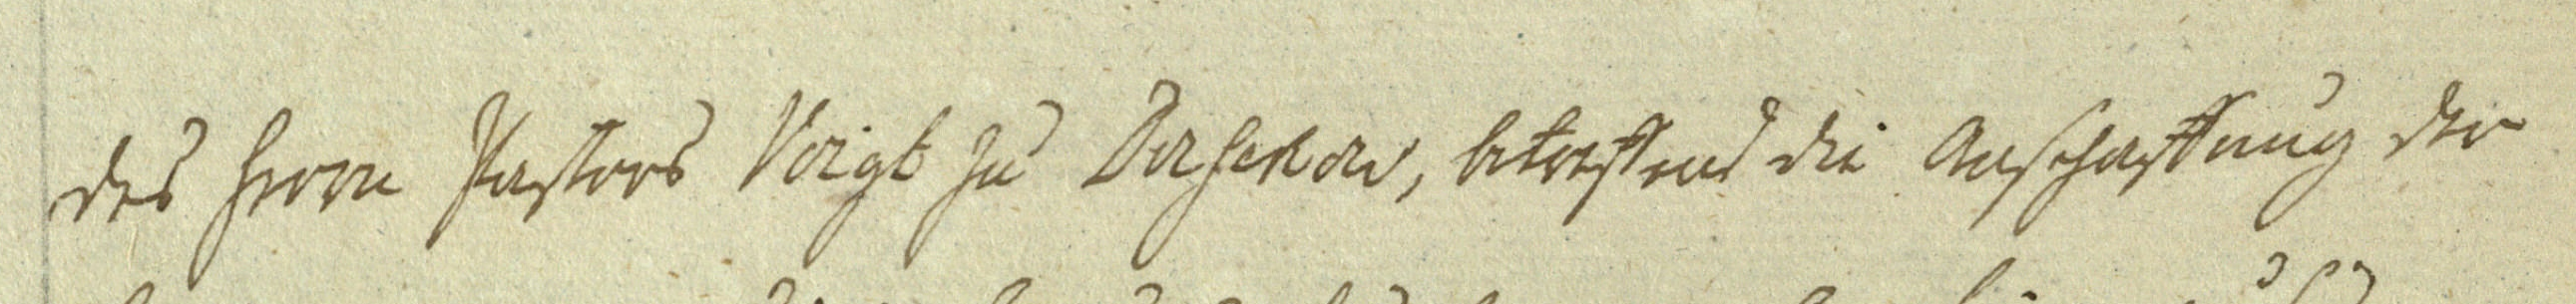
des Herrn Pastors Voigt zu Dersekow, betreffend die Anschaffung der
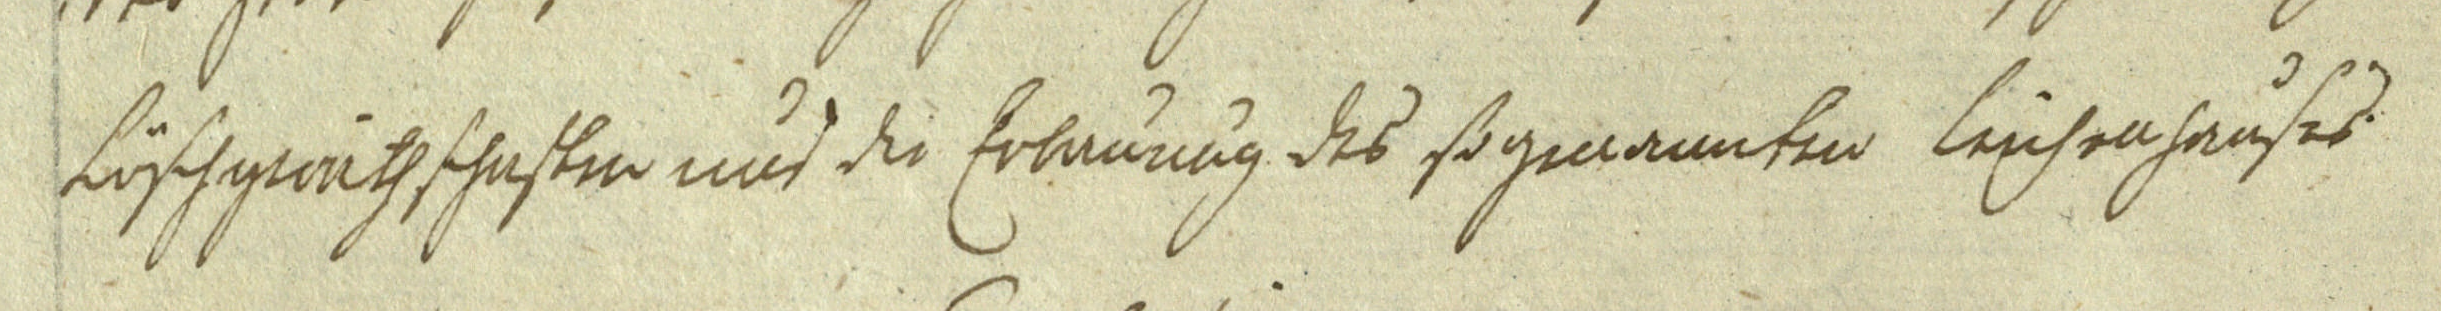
Löschgeräthschaften und die Erbauung des sogenannten Leichenhauses.
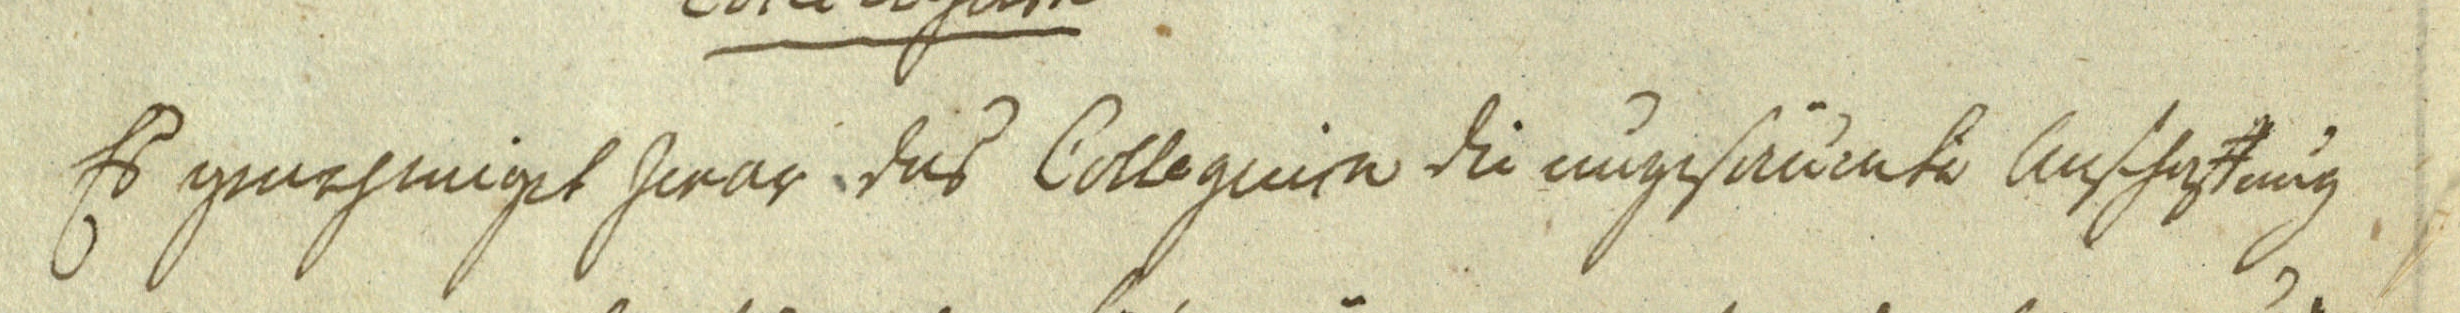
Es genehmiget zwar das Collegium die ungesäumte Anschaffung
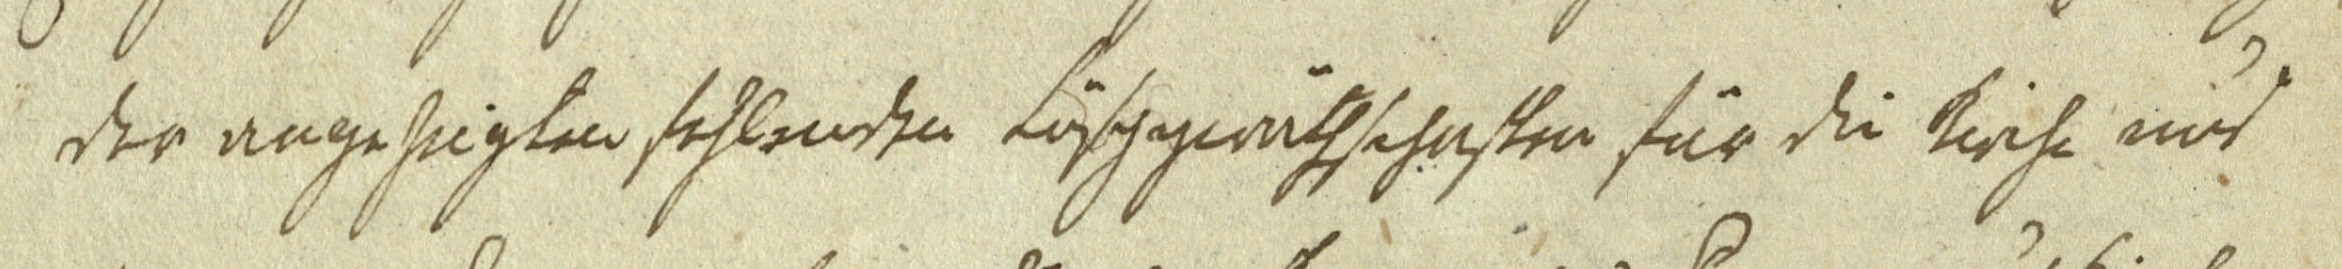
der angezeigten fehlenden Löschgeräthschaften für die Kirche und
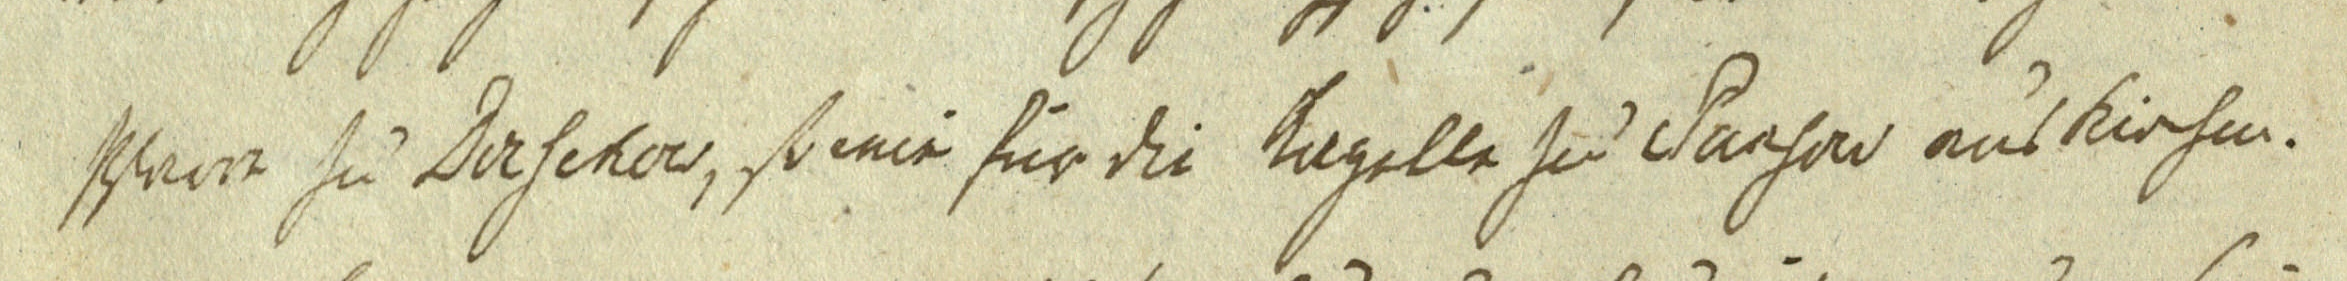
Pfarre zu Dersekow, so wie für die Kapelle zu Pansow aus Kirchen-
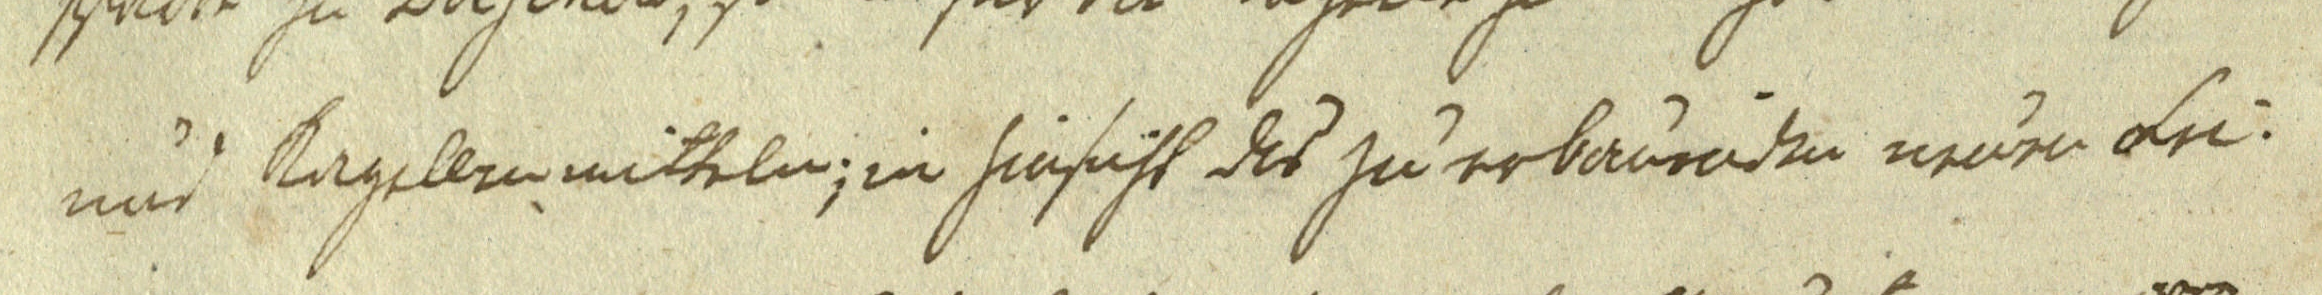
und Kapellenmitteln; in Hinsicht des zu erbauenden neuen Lei¬
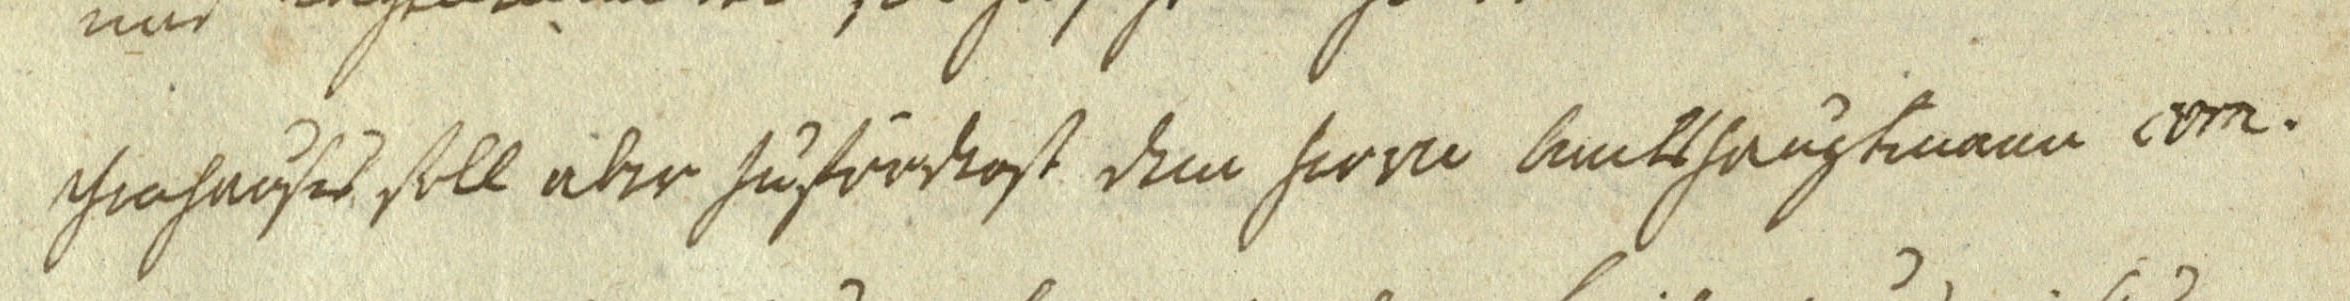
chenhauses soll aber zuförderst dem Herrn Amtshauptmann com¬
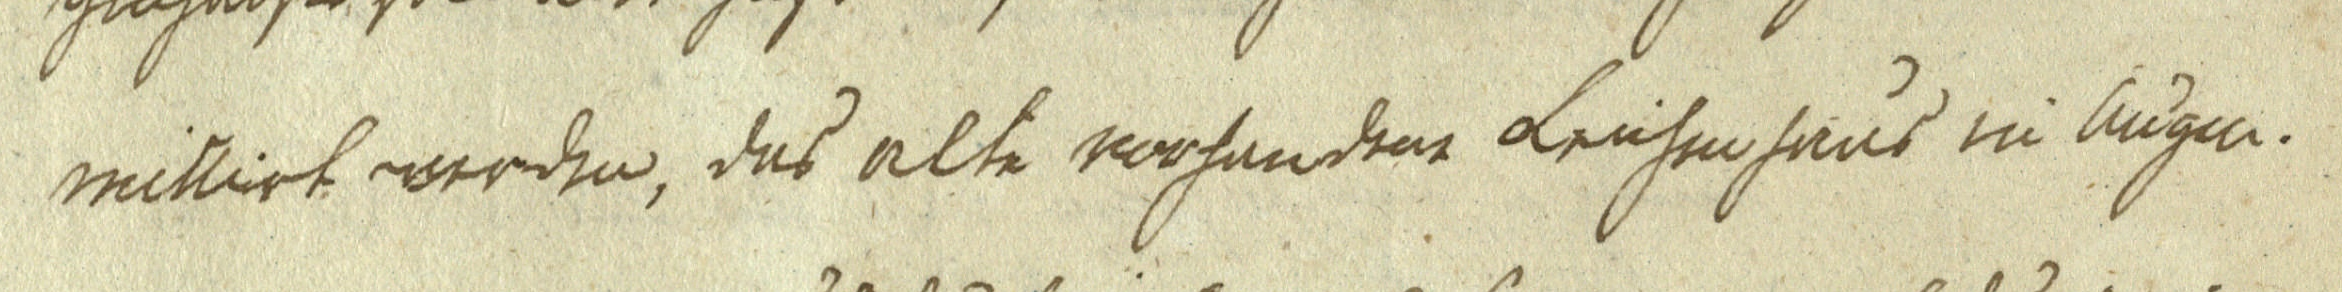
mittirt werden, das alte vorhandene Leichenhaus in Augen¬
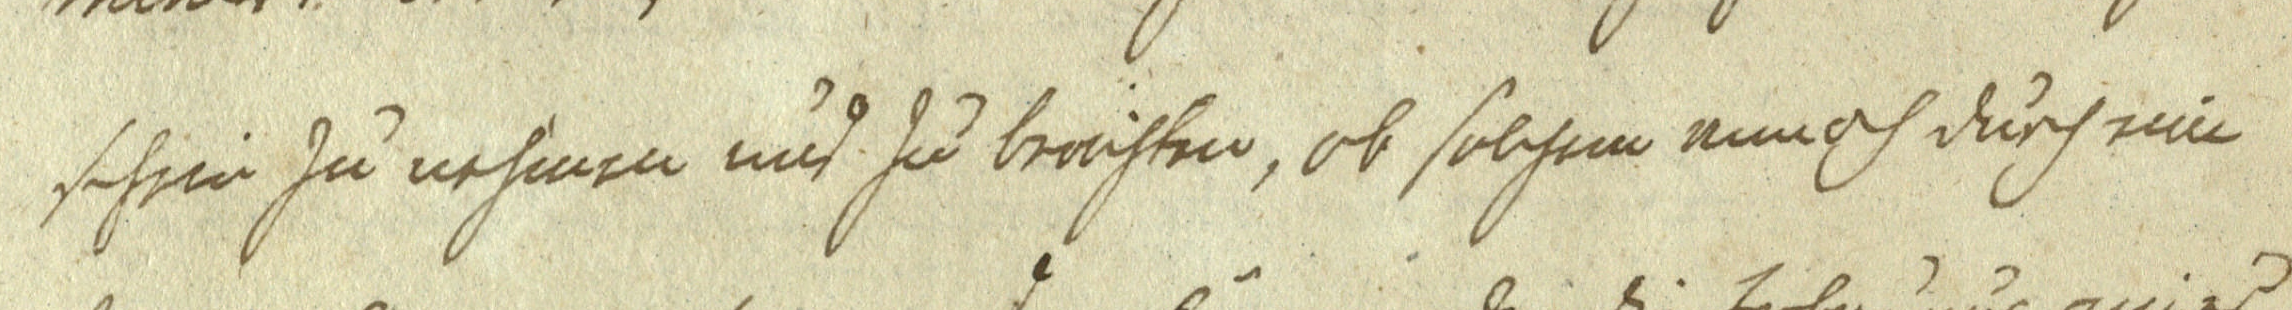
schein zu nehmen und zu berichten, ob solchem annoch durch eine
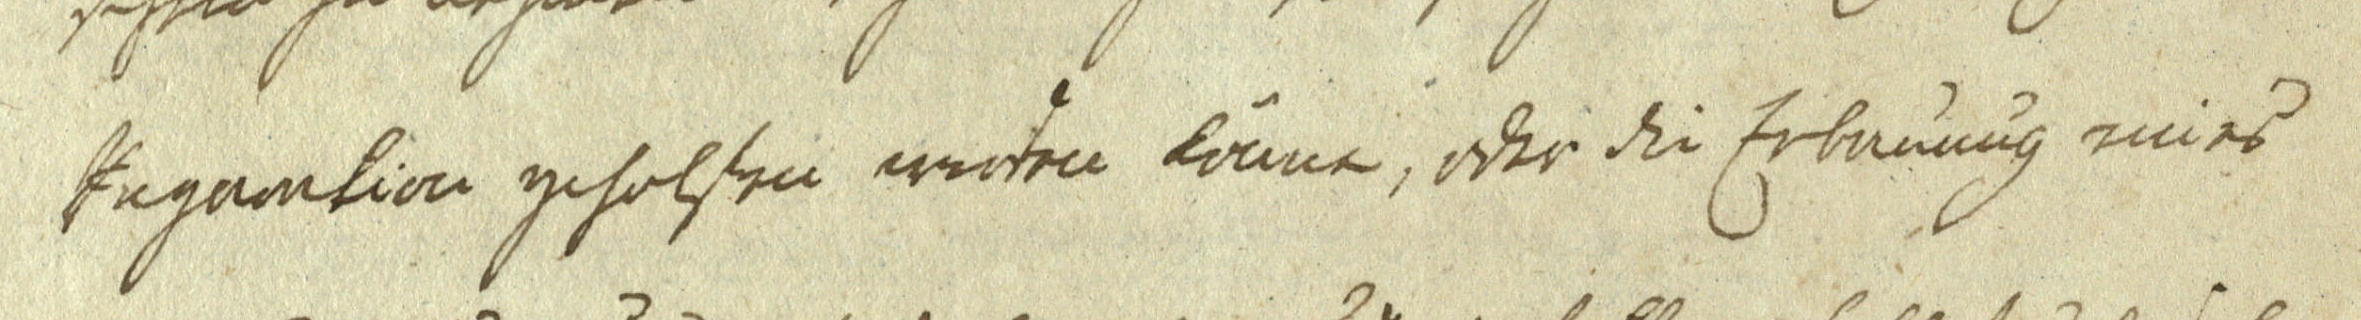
Reparation geholfen werden könne, oder die Erbauung eines
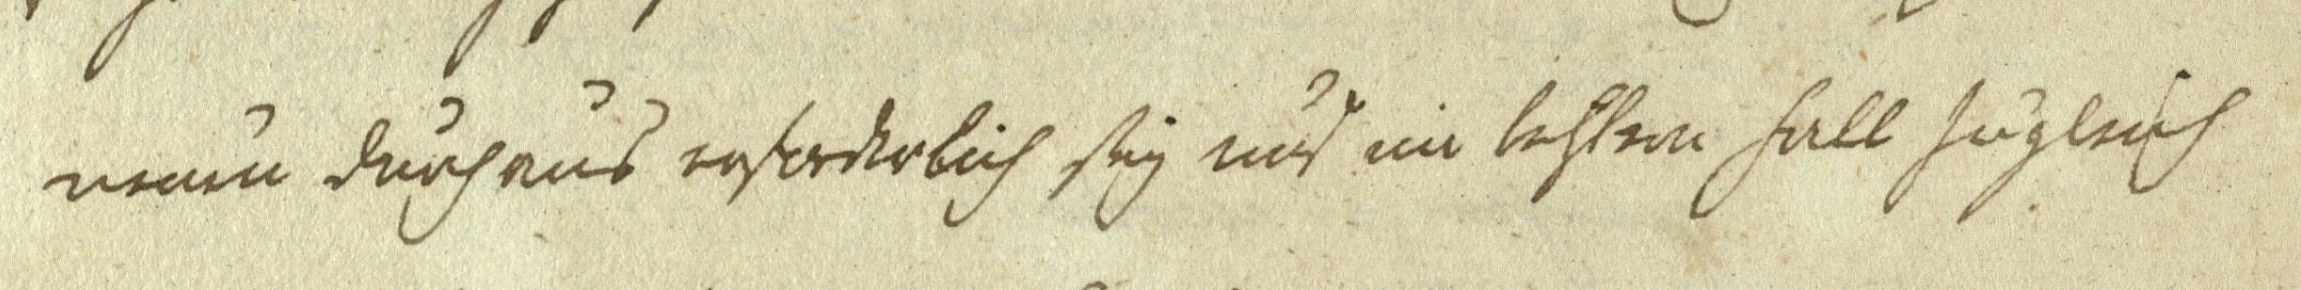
neuen durchaus erforderlich seÿ und im letztern Fall zugleich
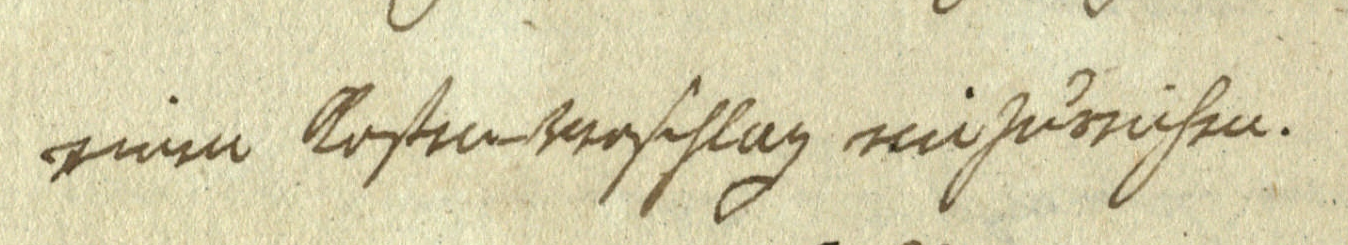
einen KostenVerschlag einzureichen.
